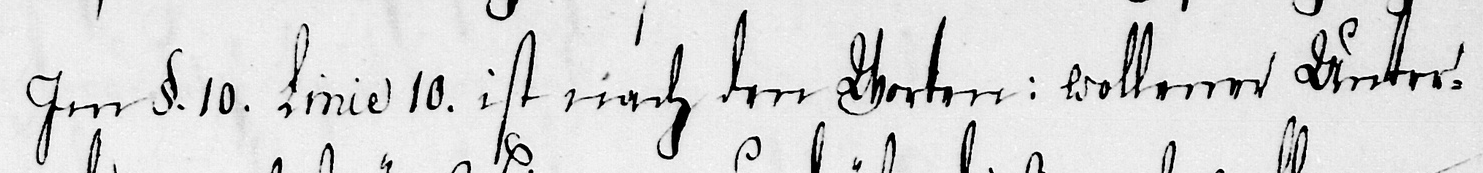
Im §. 10. Linie 10. ist nach den Worten: wollener Unter¬
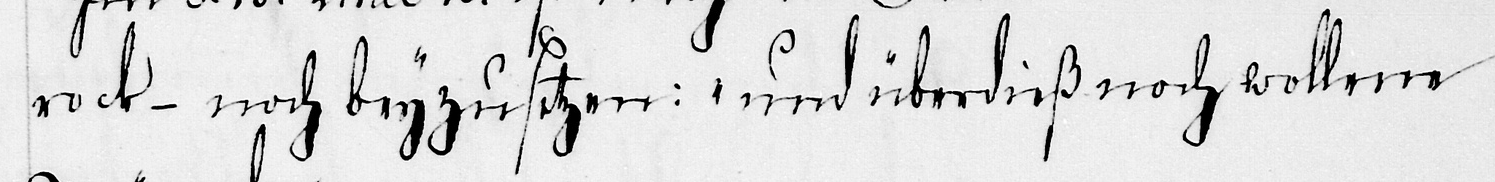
rock – noch beyzusetzen: „und überdieß noch wollene
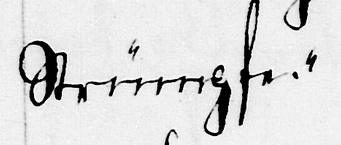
Strümpfe.“
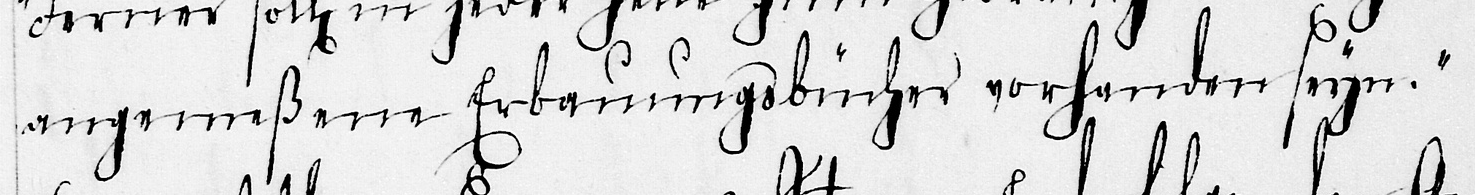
angemeßene Erbauungsbücher vorhanden seyn.“
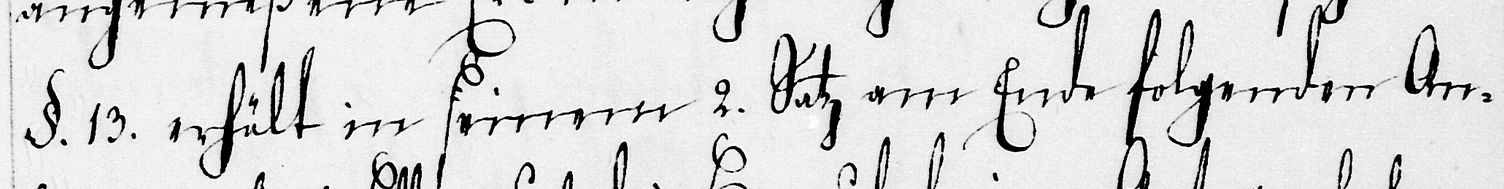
§. 13. erhält in seinem 2. Satz am Ende folgenden An¬
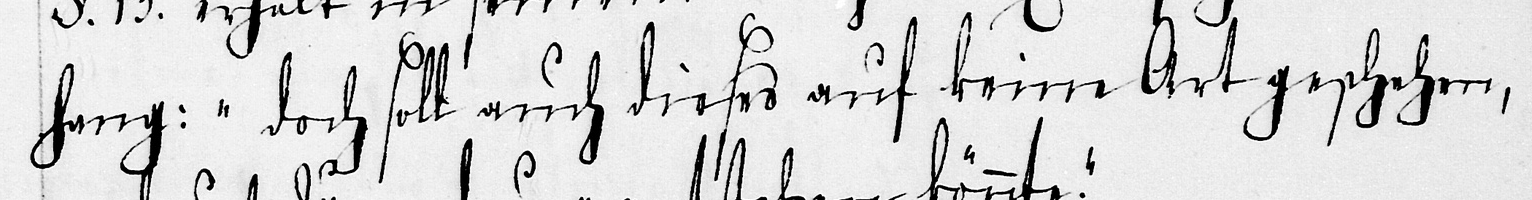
hang: „ doch soll auch dieses auf keine Art geschehen,
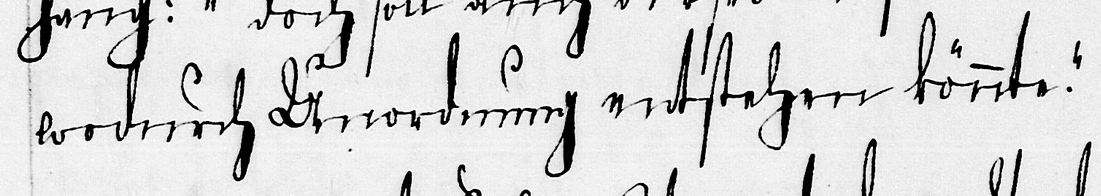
wodurch Unordnung entstehen könnt¬
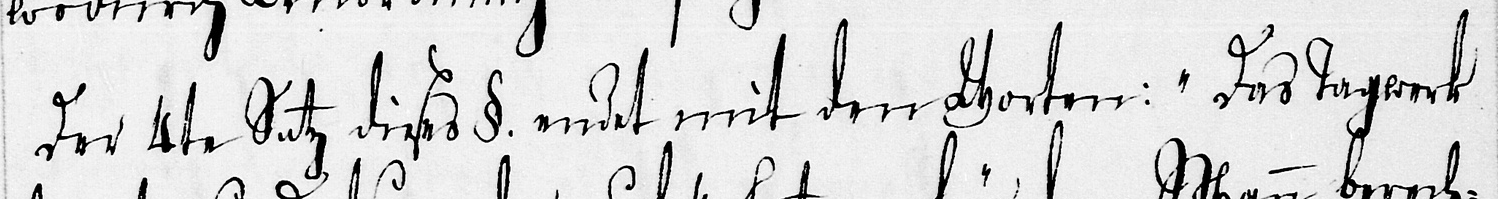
Der 4te Satz dieses §. endet mit den Worten: „Das Tagewerk
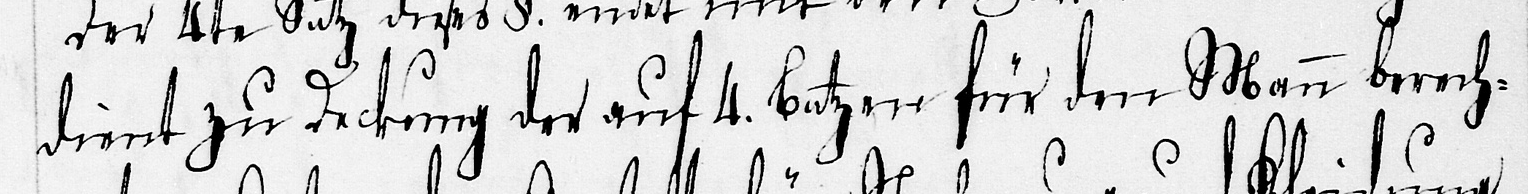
dient zur Deckung der auf 4. Batzen für den Mann berech¬
